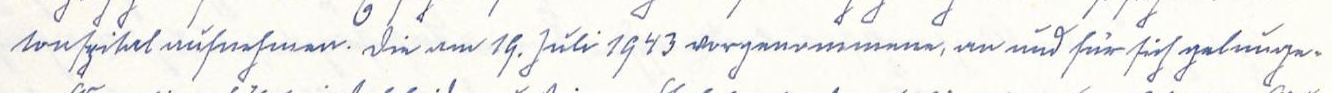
tonspital aufnehmen. Die am 19. Juli 1943 vorgenommene, an und für sich gelunge-
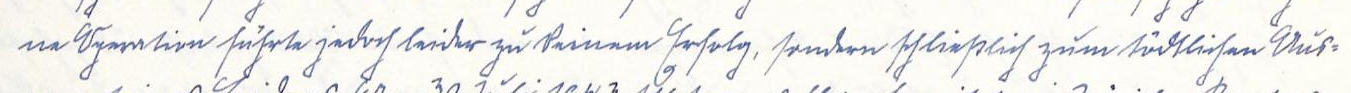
nie Operation führte jedoch leider zu keinem Erfolg, sondern schließlich zum tödtlichen Aus-
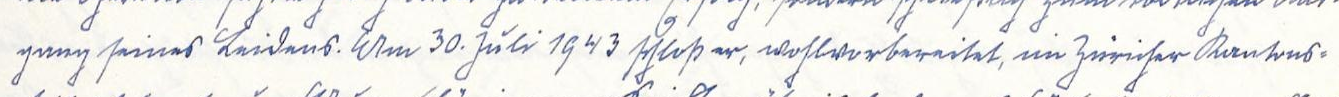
gang seines Leidens. Am 30. Juli 1943 schloß er, wohlvorbereitet, im Züricher Kantons-
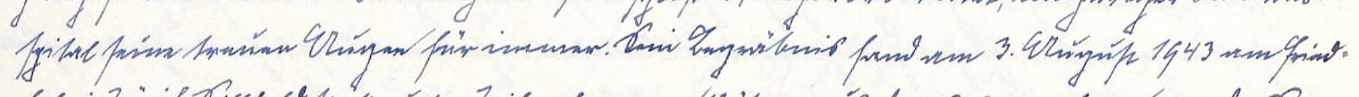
spital seine treuen Augen für immer. Sein Begräbnis fand am 3. August 1943 am Fried-
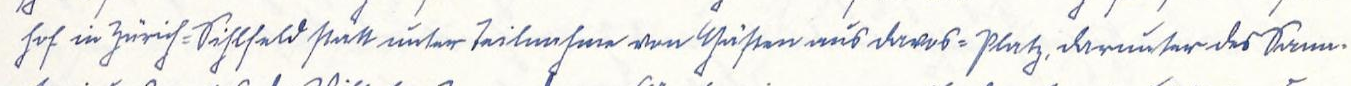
hof in Zürich Sihlfeld statt unter Teilnahme von Gästen aus Davos-Platz, darunter des Sana-
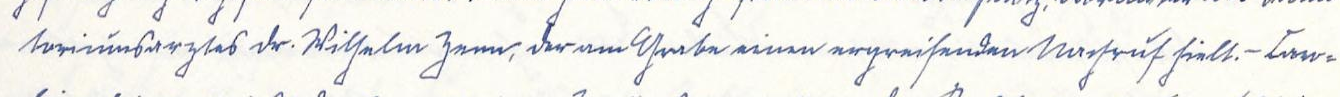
toriumsarztes Dr. Wilhelm Zenn der am Grabe einen ergreifende Nachruf hielt. - Caro-
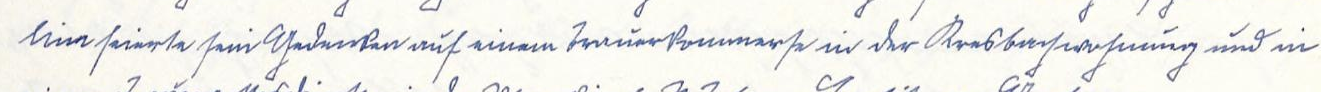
lina feierte sein Gedenken auf einem Trauerkommerse in der Kresbachwohnung und in
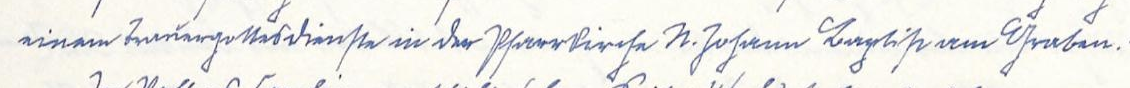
einem Trauergottesdienst in der Pfarrkirche St. Johann Baptist am Graben.-
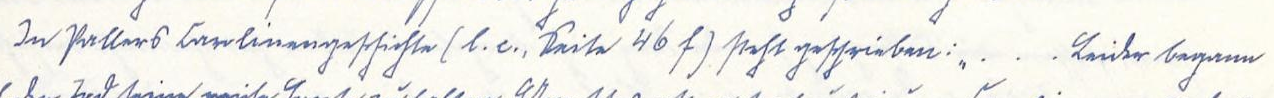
Im Pallers Carolinengeschichte (l. c. Seite 46 f) steht geschrieben: "...Leider begann
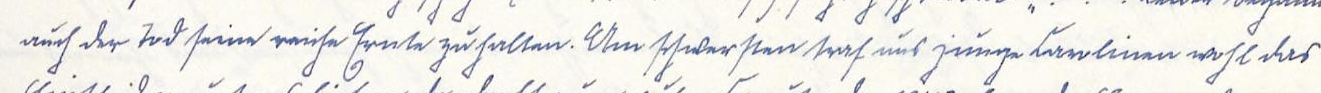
auch der Tod seine reiche Ernte zu halten. Am schwersten traf uns junge Carolinen wohl das
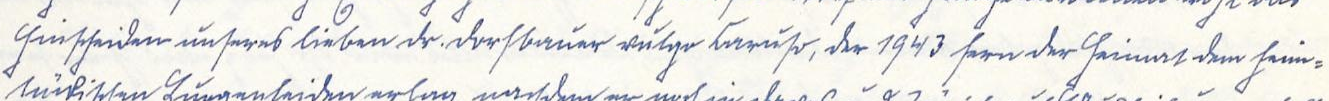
Hinscheiden unseres lieben Dr. Dorfbauer vulgo Caruso, der 1943 fern der Heimat dem heim-
